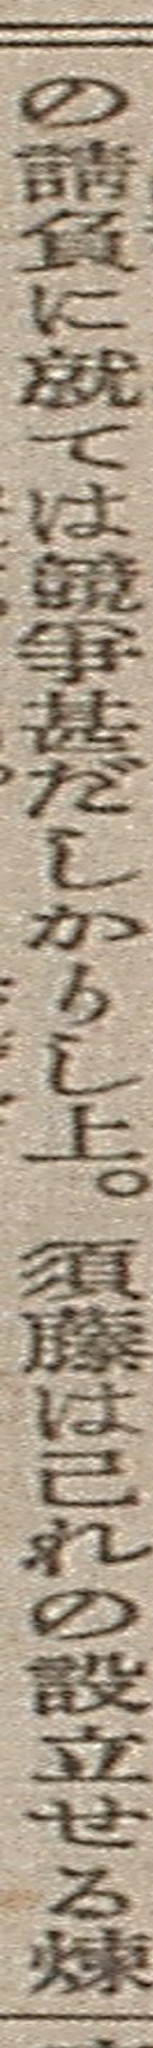の請負に就ては競争甚だしかりし上。須藤は己れの設立せる煉
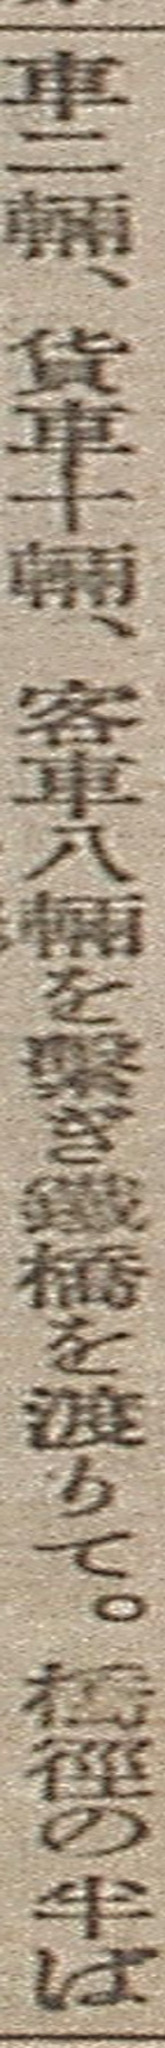車二両、貨車十両、客車八両を繋ぎ鉄橋を渡りて。橋径の半ば
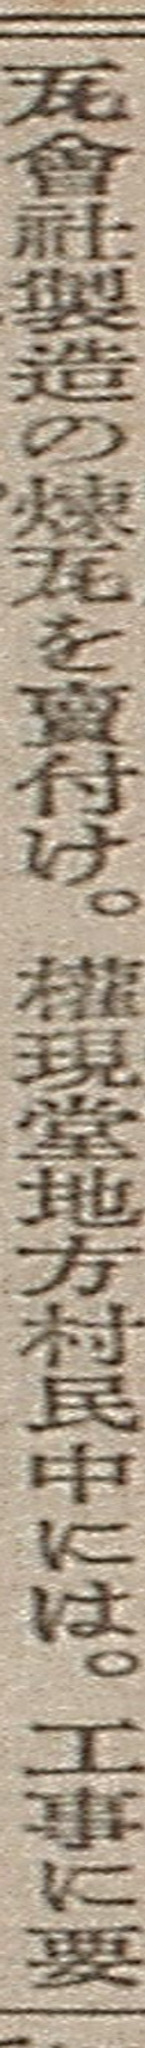瓦会社製造の煉瓦を売付け。権現堂地方村民中には。工事に要
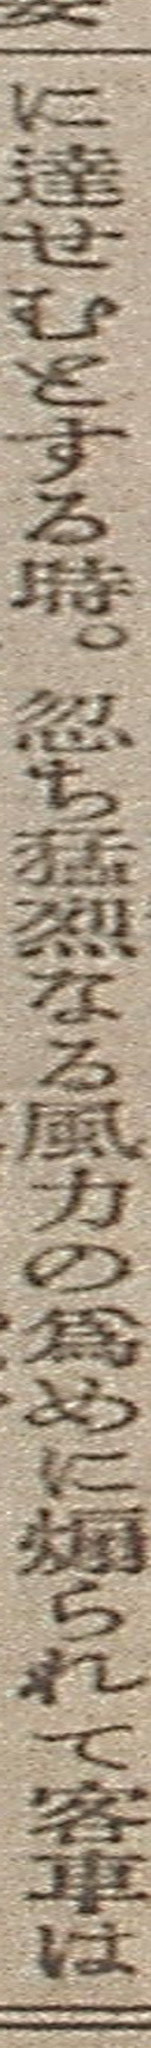に達せむとする時。忽ち猛烈なる風力の為めに煽られて客車は
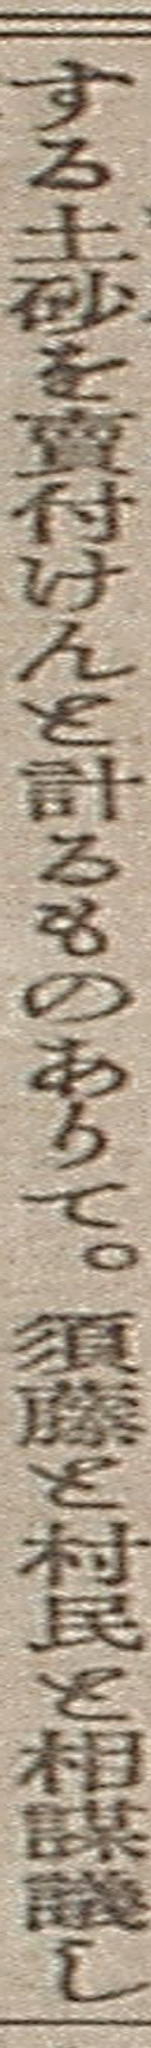する土砂を売付けんと計るものありて。須藤と村民と相謀議し
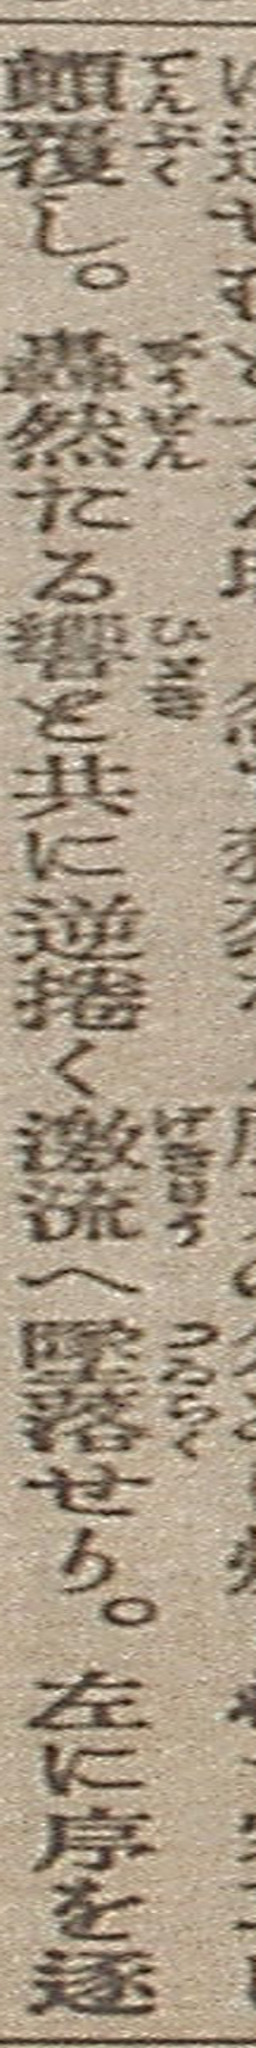顛覆し。轟然たる響と共に逆捲く激流へ墜落せり。左に序を逐
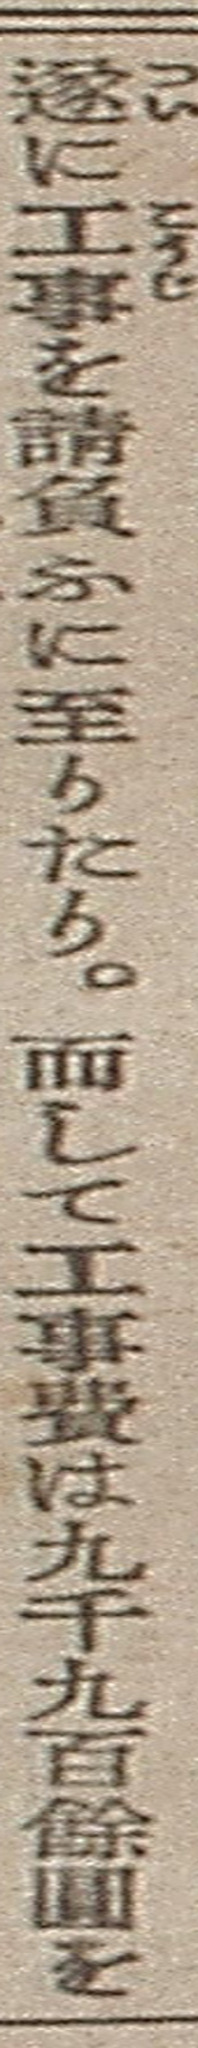遂に工事を請負ふに至りたり。而して工事費は九千九百余円を
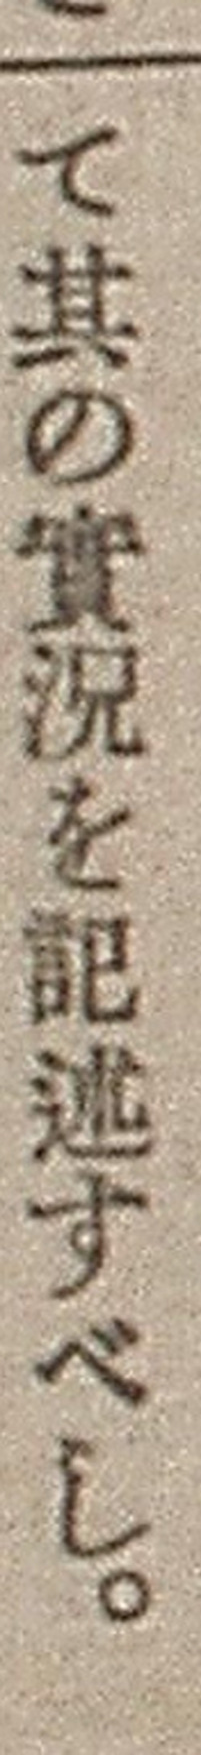て其の実況を記述すべし。
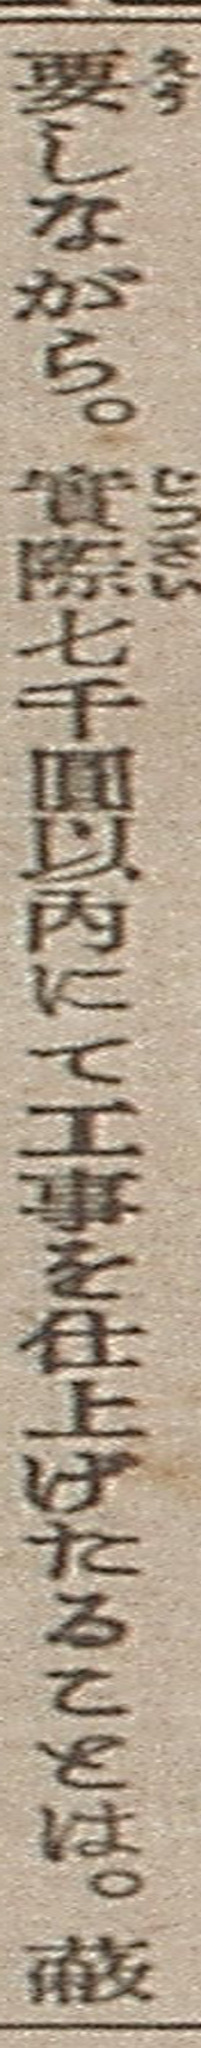要しながら。実際七千円以内にて工事を仕上げたることは。蔽
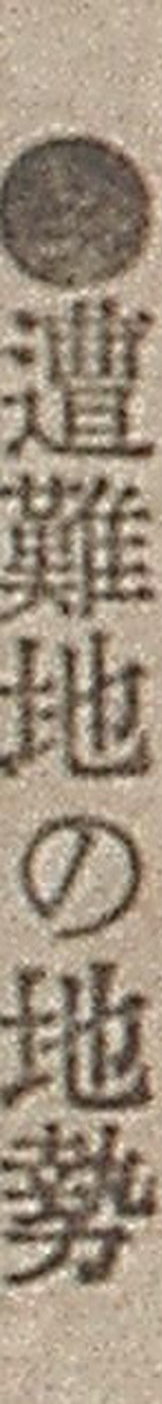●遭難地の地勢
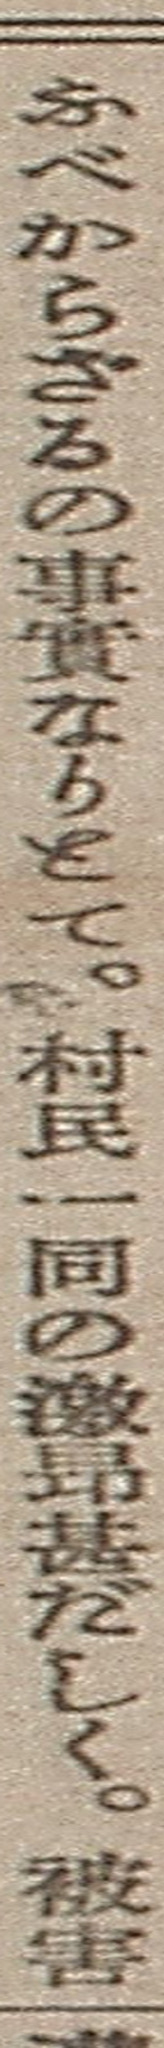ふべからざるの事実なりとて。村民一同の激昂甚だしく。被害
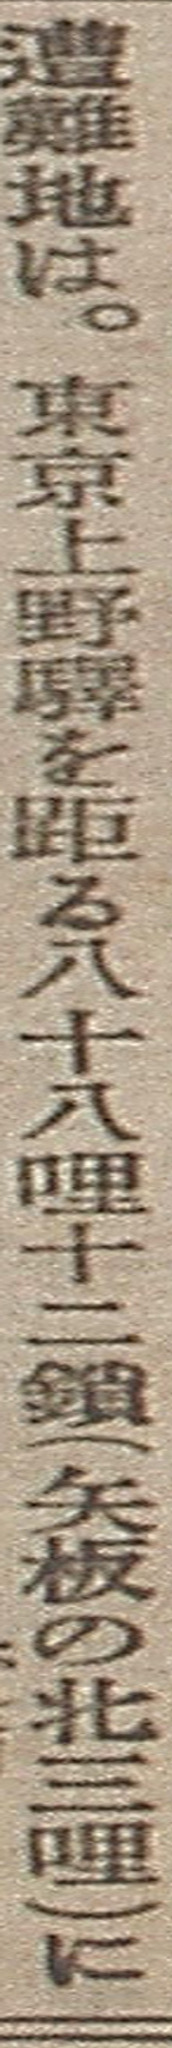遭難地は。東京上野駅を距る八十八哩十二鎖に
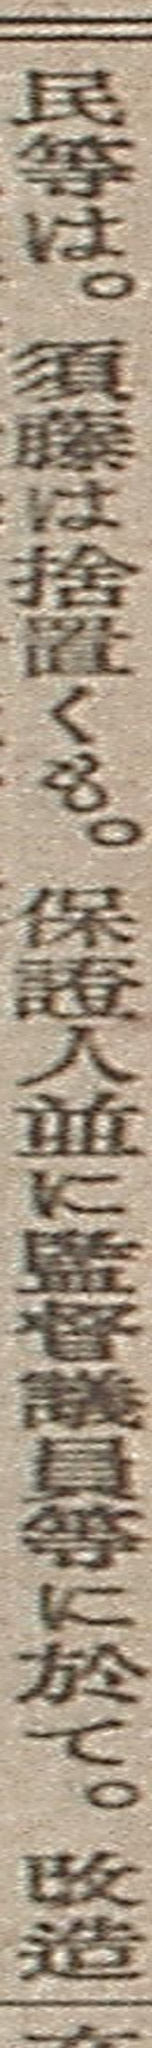民等は。須藤は捨置くも。保証人並に監督議員等に於て。改造
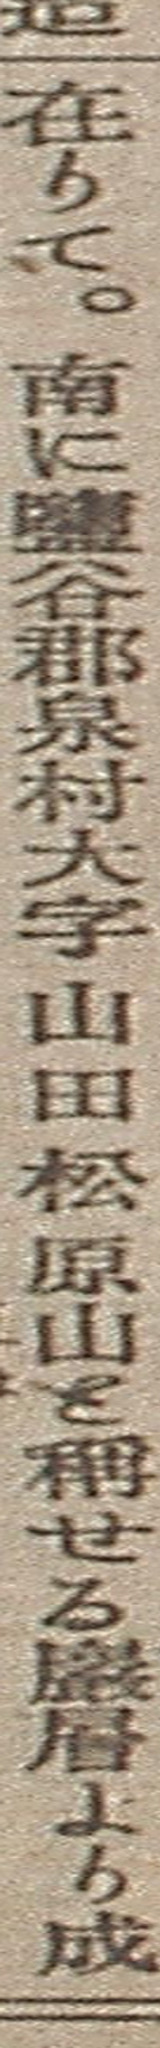在りて。南に塩谷郡泉村大字山田松原山と称せる巌層より成
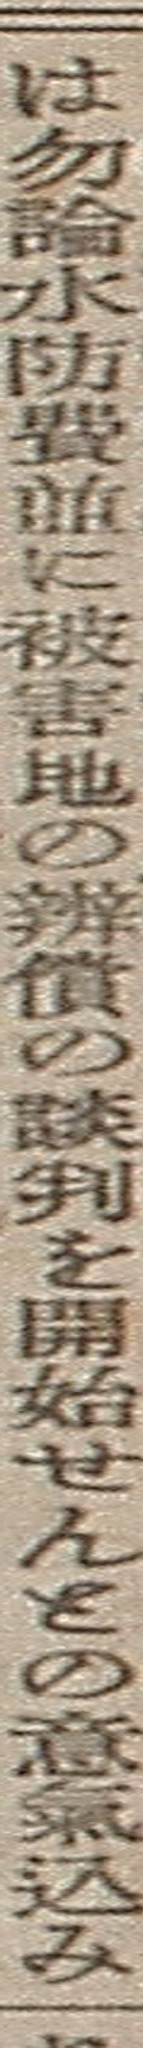は勿論水防費並に被害地の弁償の談判を開始せんとの意気込み
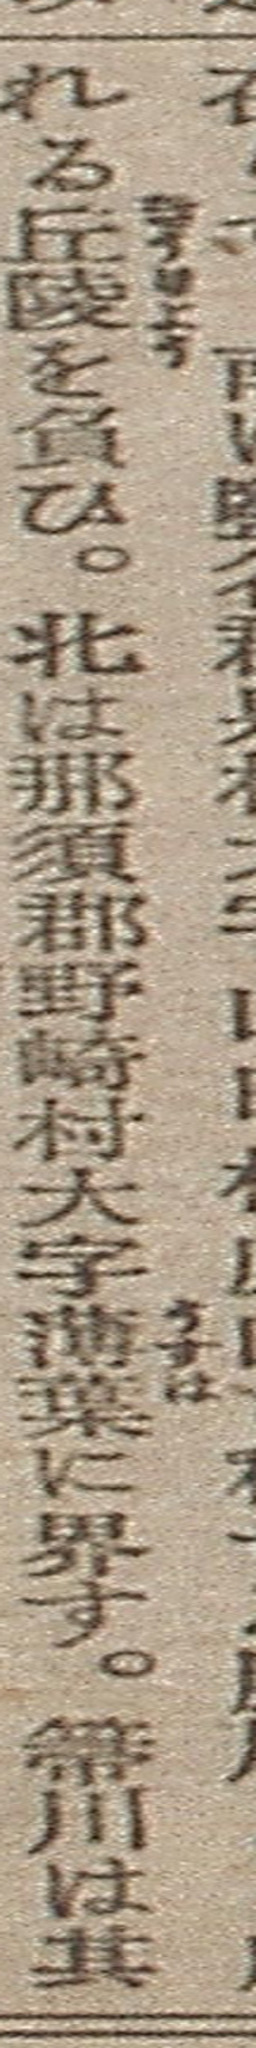れる丘陵を負ひ。北は那須郡野崎村大字薄葉に界す。箒川は其
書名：風俗畫報臨時増刊第百九十九號　明治三十二年十月各地災害圖會（前編之續）
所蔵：東京大学地震研究所図書室 Earthquake Research Institute Library, The University of Tokyo, JAPAN
